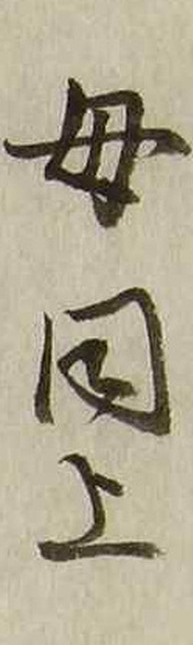母同上
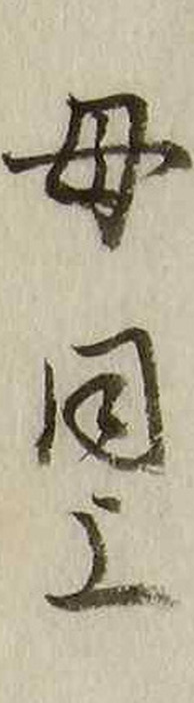母同上
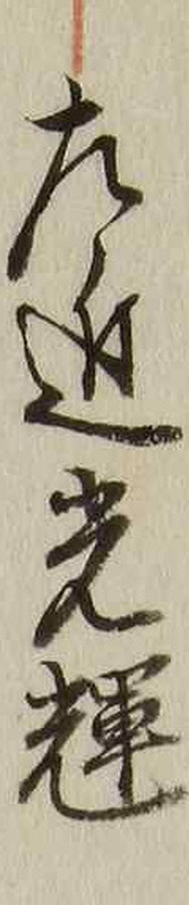左近光輝
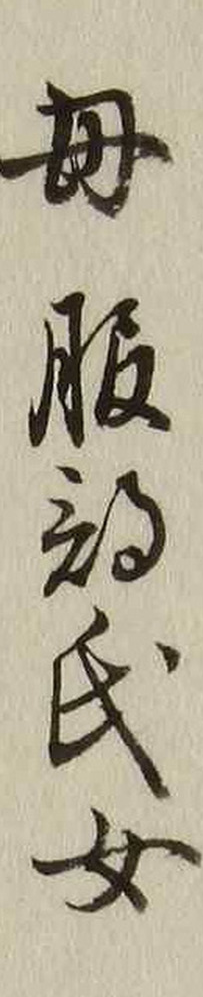母服部氏女
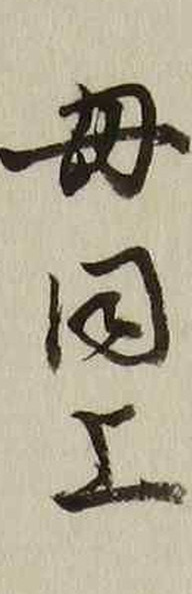母同上
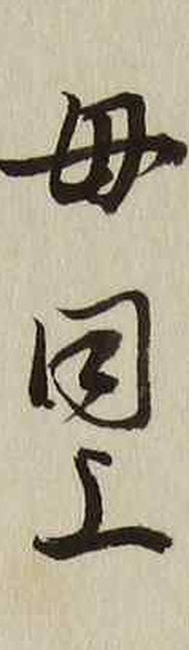母同上

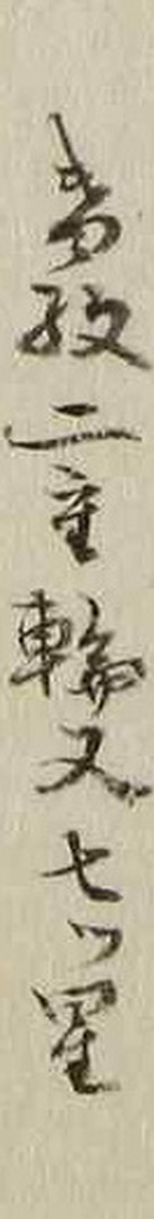替紋二重輪又七ツ星
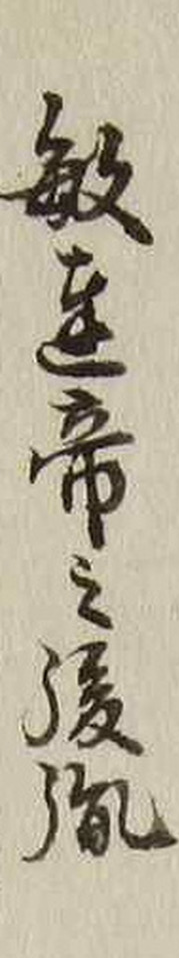敏達帝之後胤
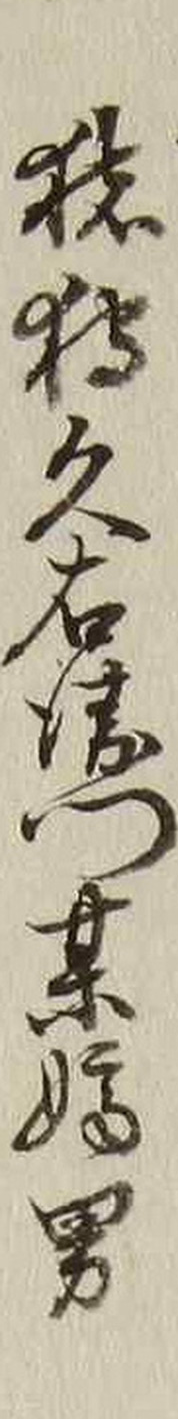猪狩久右衛門某嫡男
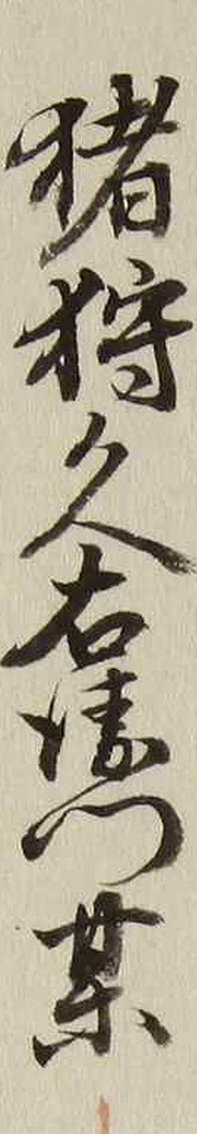猪狩久右衛門某
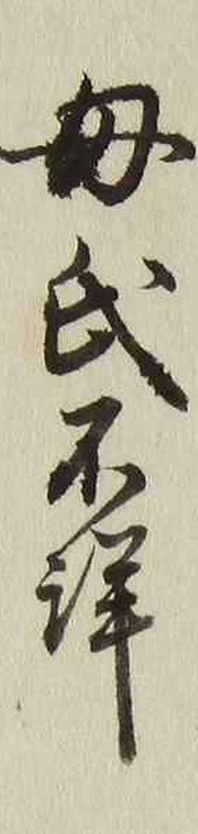母氏不詳
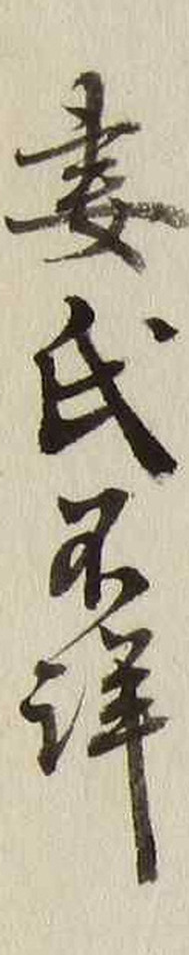妻氏不詳
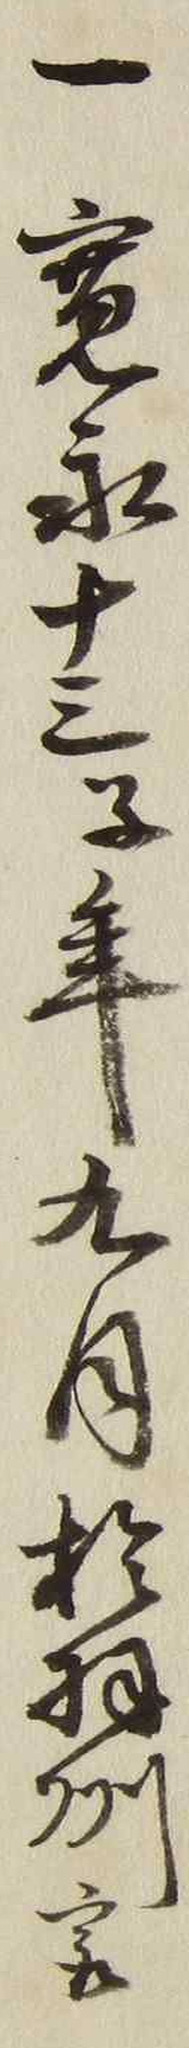一寛永十三子年九月於羽州最

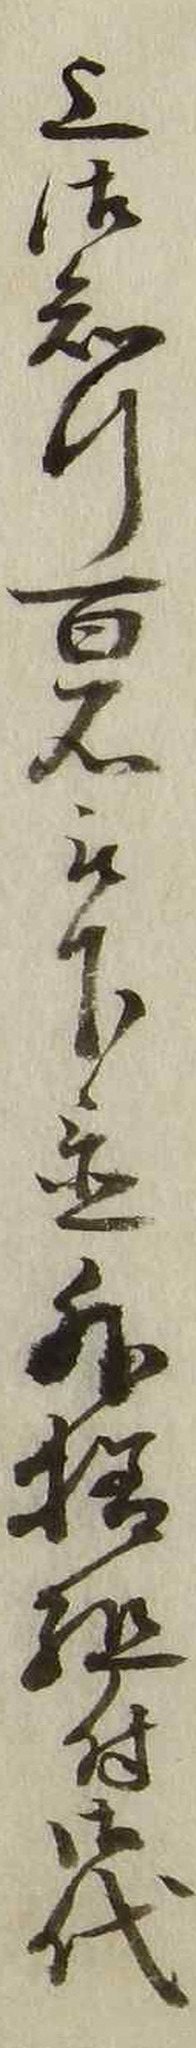上御知行百石被下置外様組付御代
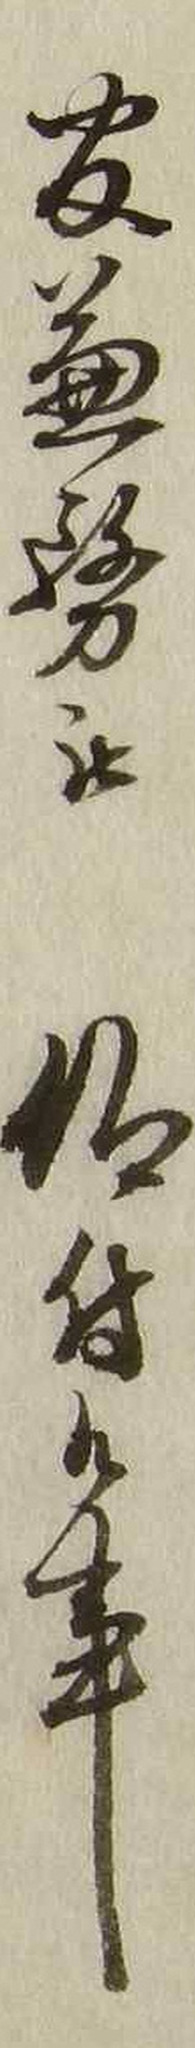官兼務被仰付候事
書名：諸士系譜　巻之27　い之部27
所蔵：会津若松市立会津図書館
